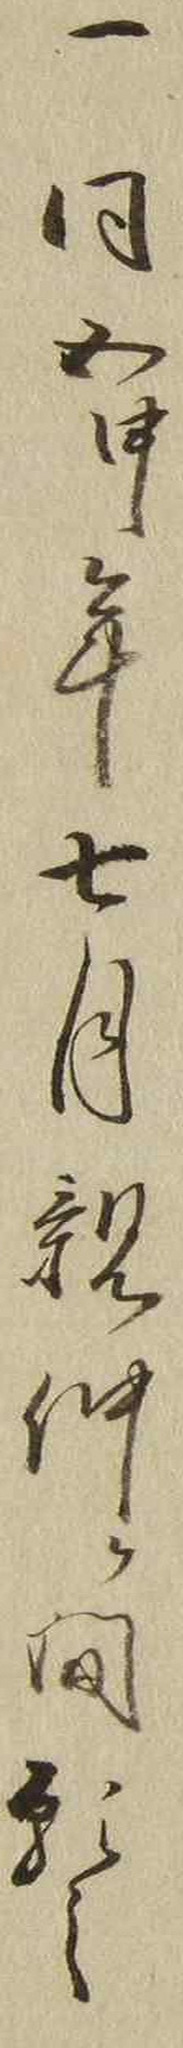一同五申年七月親仲ケ間願之
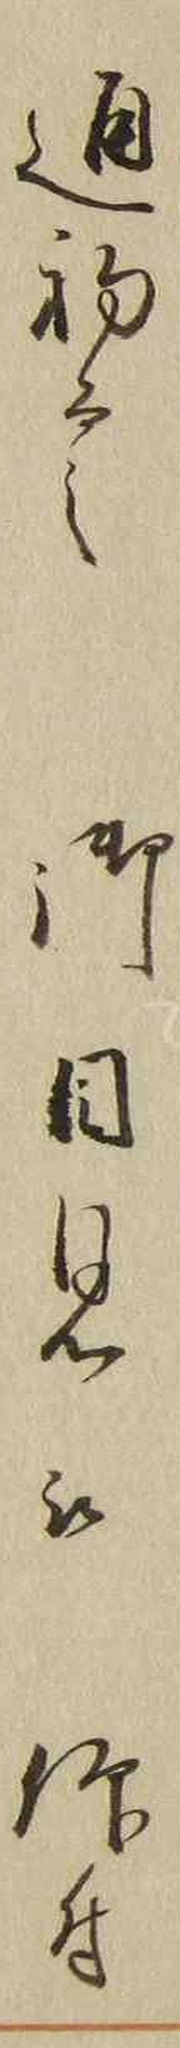通初而之御目見被仰付

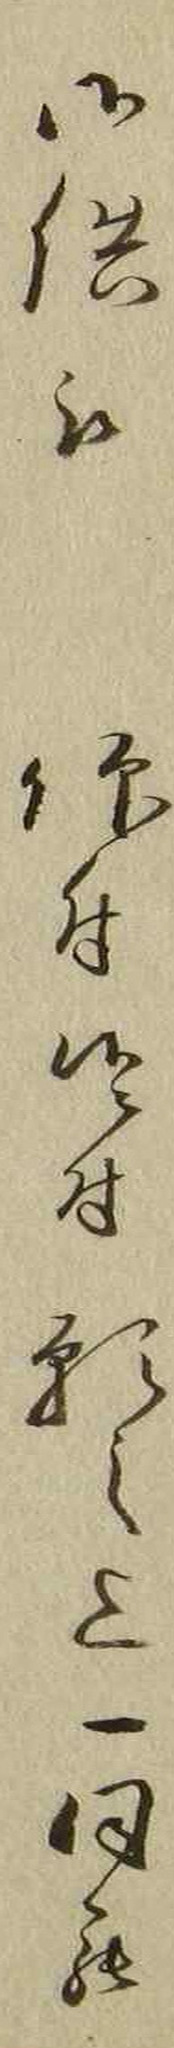御供被仰付候ニ付願之上一同罷
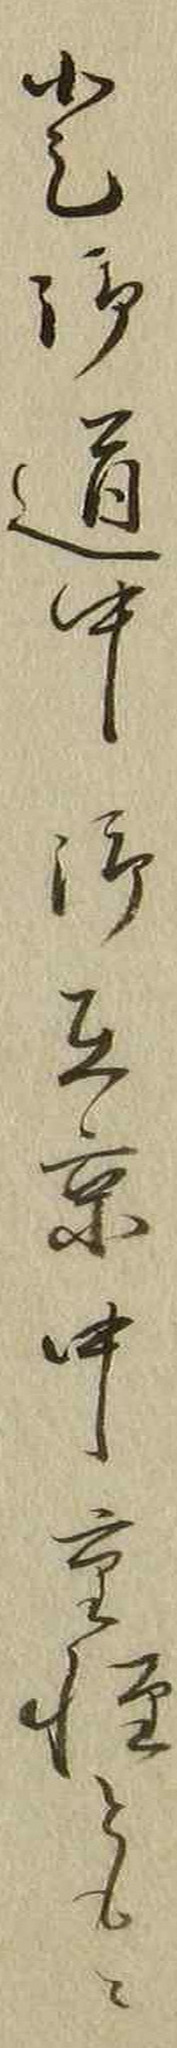登御道中御在京中重軽ともニ
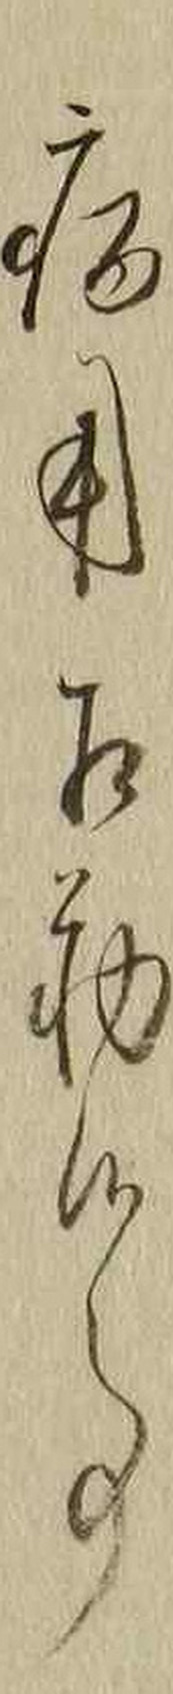病用相勤候事
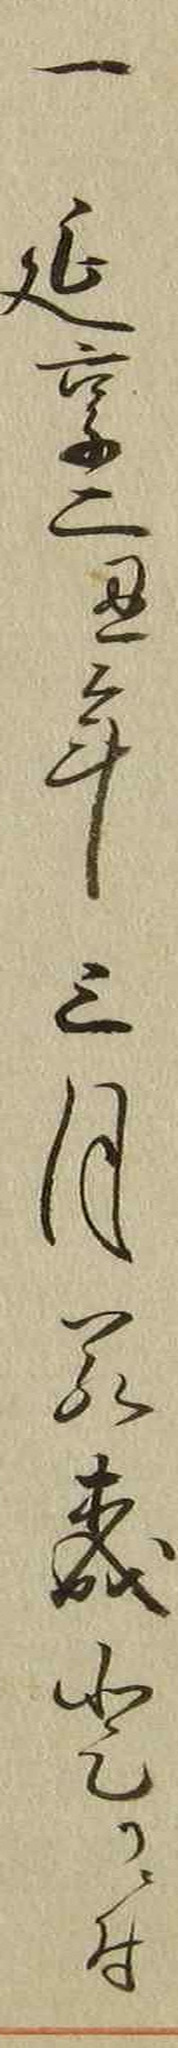一延享ニ丑年三月若森登りニ付
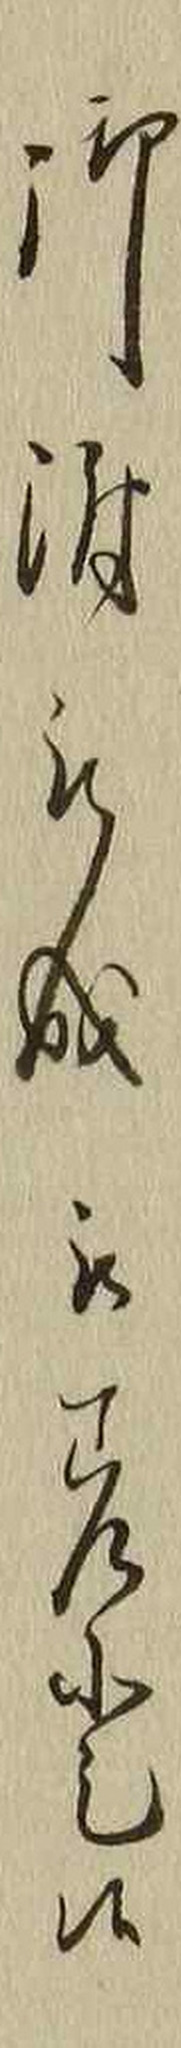御附被成被差登候
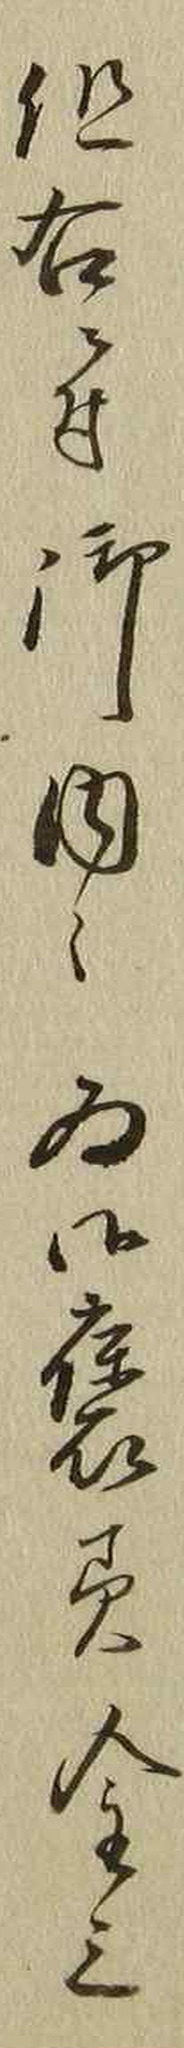但右ニ付御内々為御褒美金三
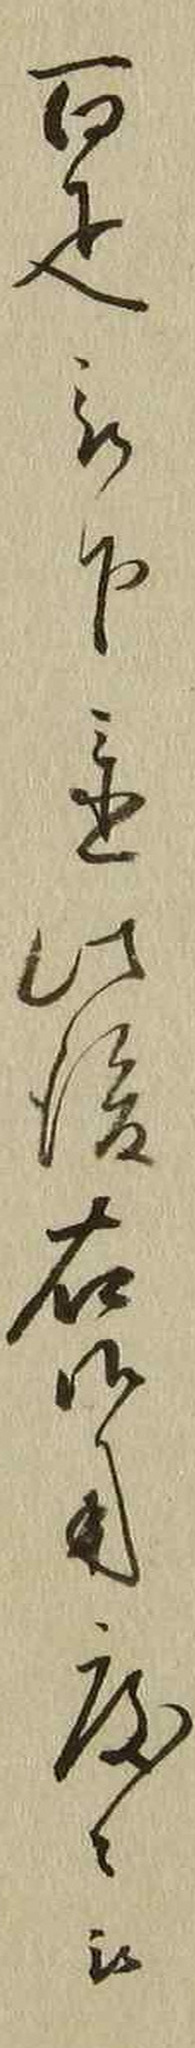百疋被下置此後右御用度ニ被
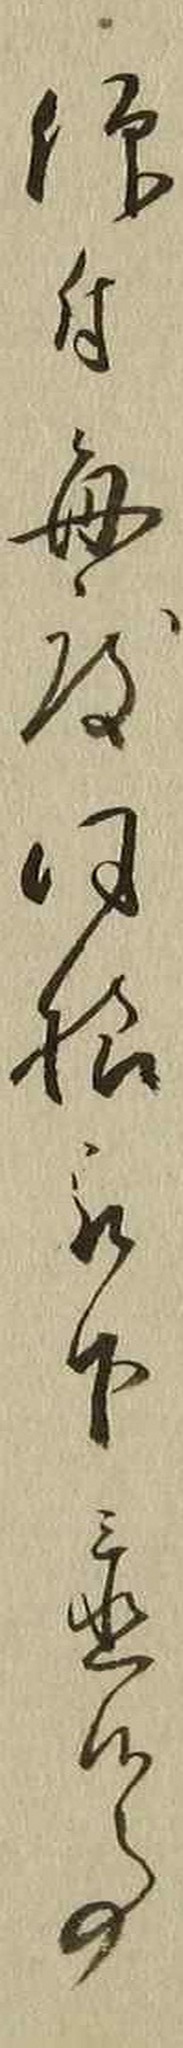仰付毎度同様被下置候事
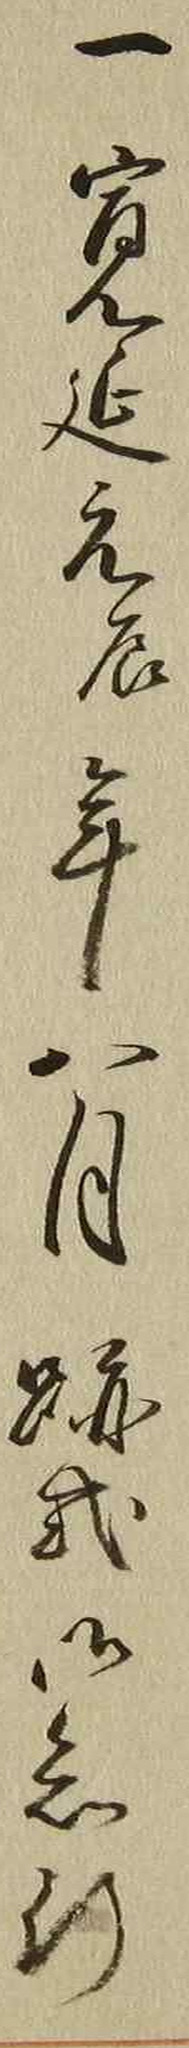一寛延元辰年八月跡式御知行
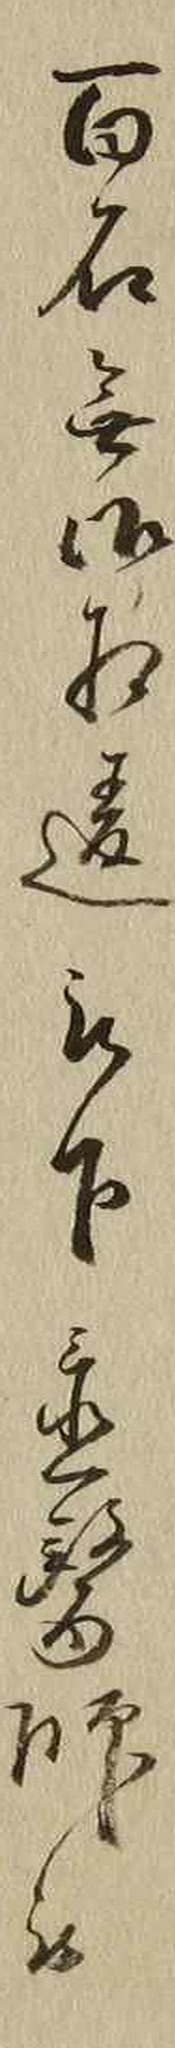百石無御相違被下置医師被
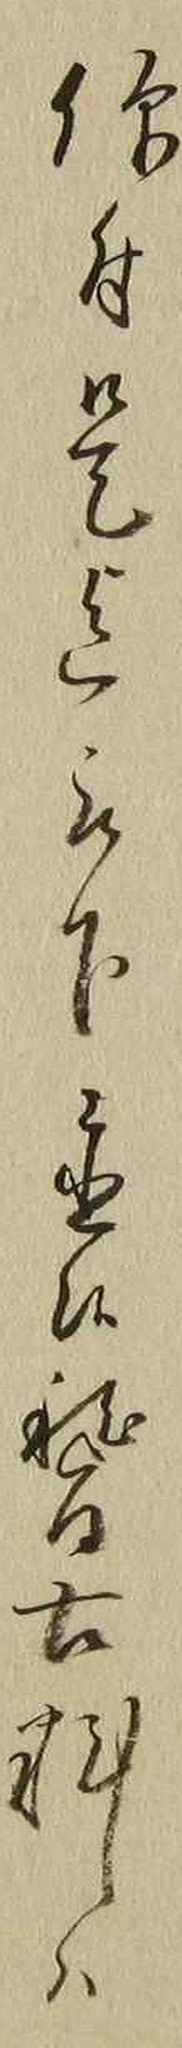仰付是迄被下置候稽古料ハ
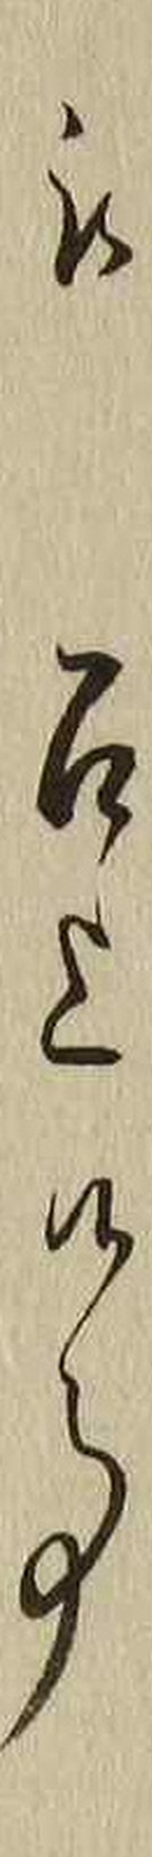被召上候事
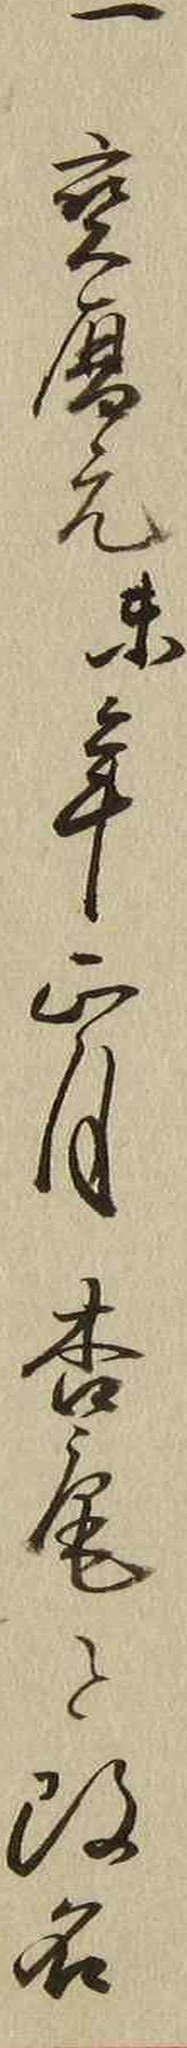一宝暦元未年正月杏庵と改名
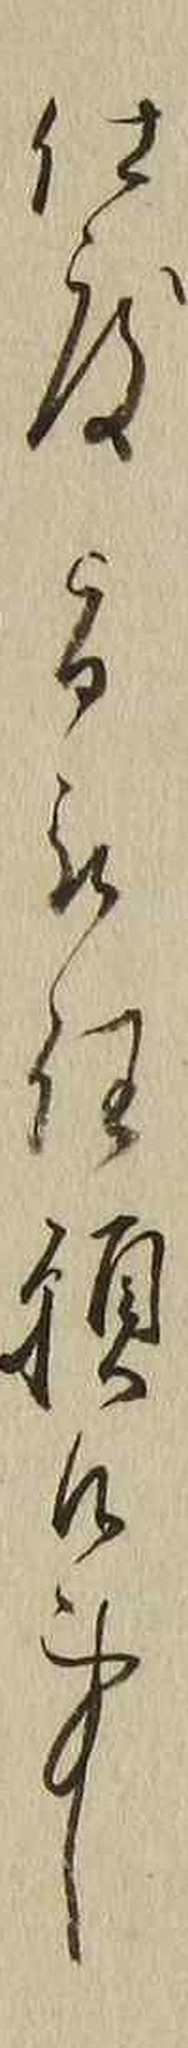仕度旨被任願候事
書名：諸士系譜　巻之68　を之部2
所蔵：会津若松市立会津図書館
